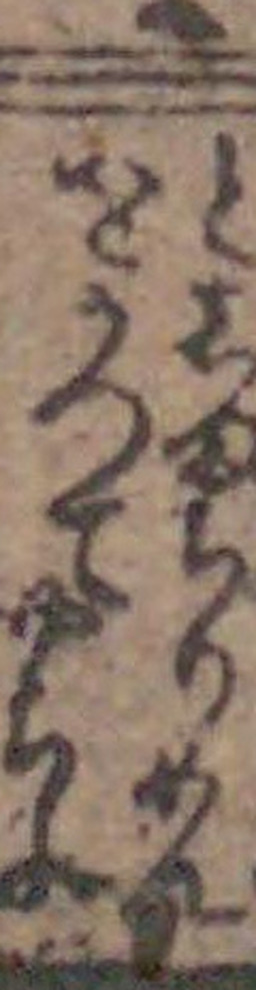をかつてやらふ
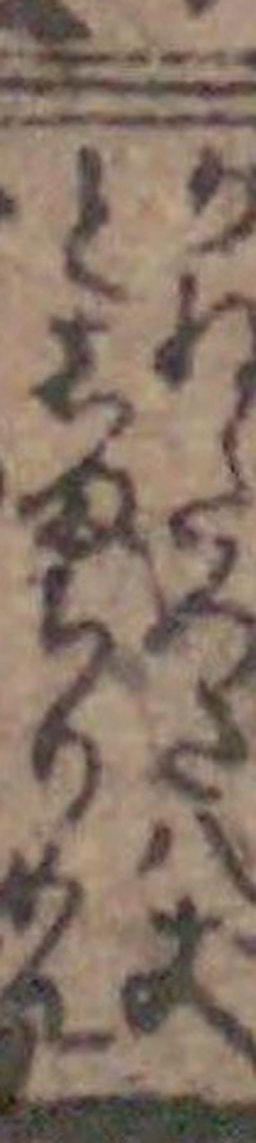としまちりめん
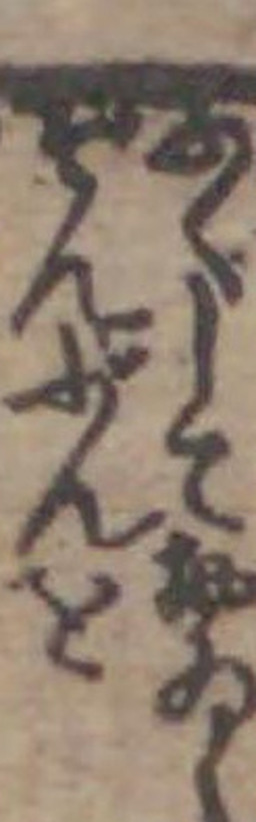ぞんぶんを
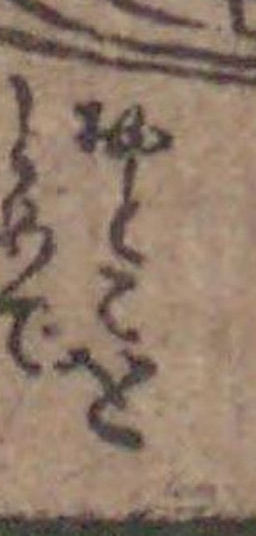おとこを
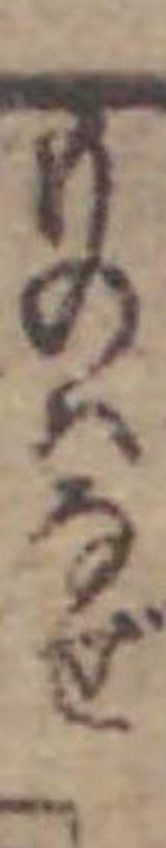ものはなぜ
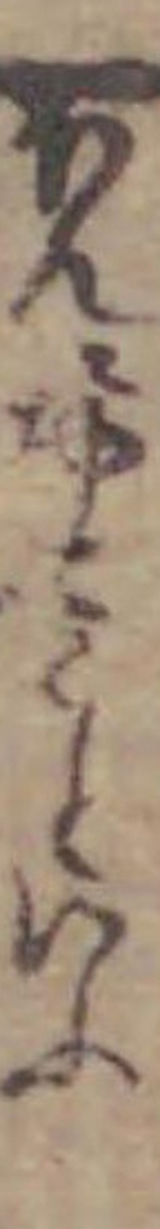ほんにおとこといふ
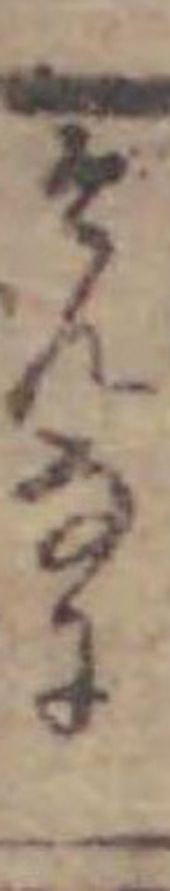そんなに
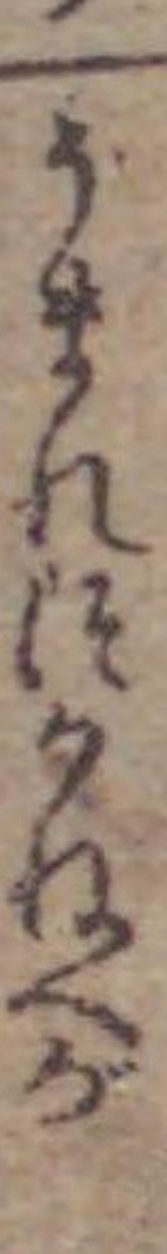うまれつかねへが
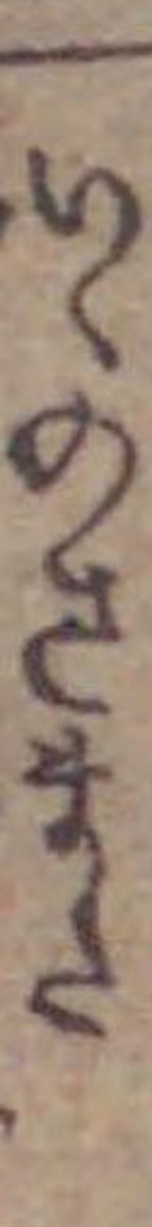いゝのさまた
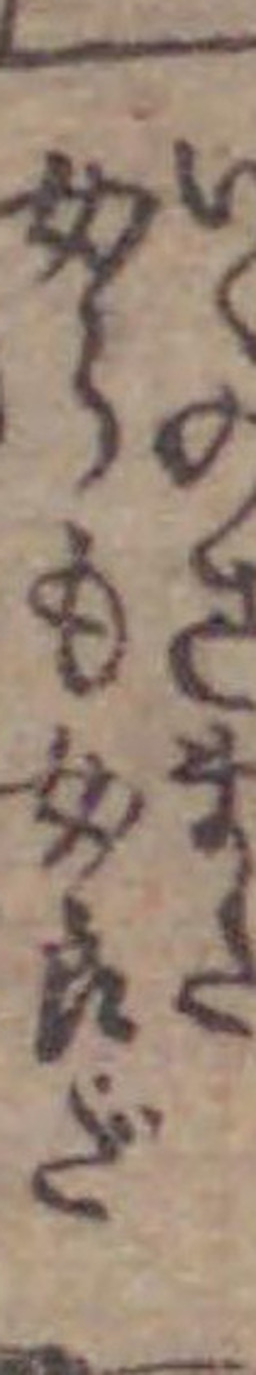女郎も女郎だ
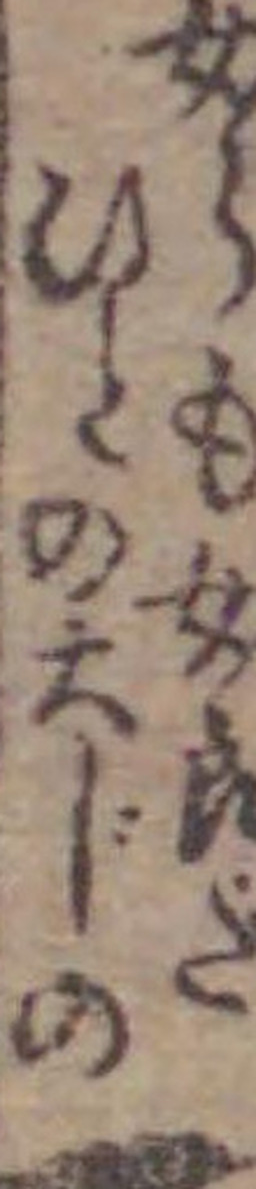ひとの大事の
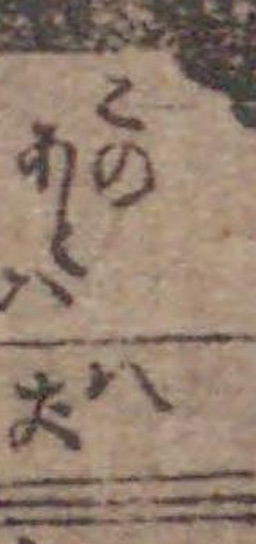あとは

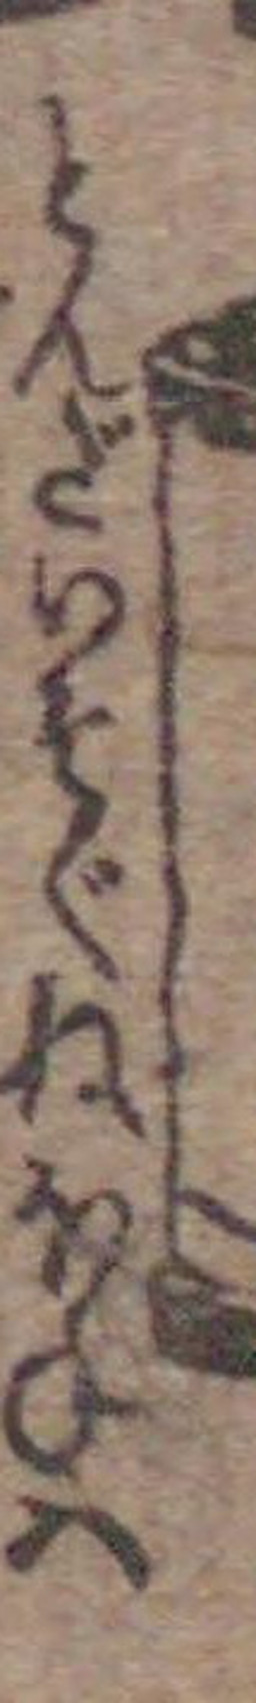とんだいそぐねほねは
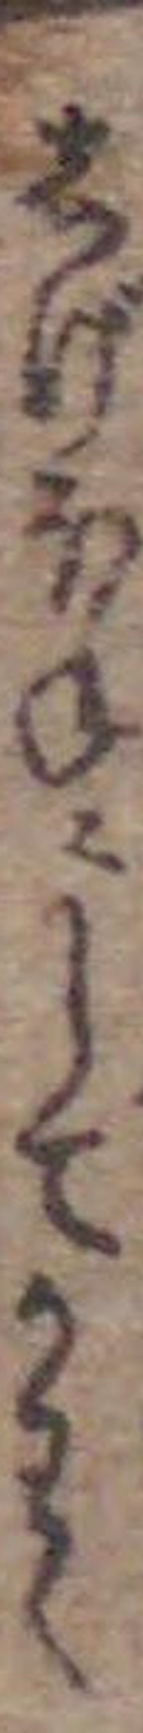しげほねにしてかわく
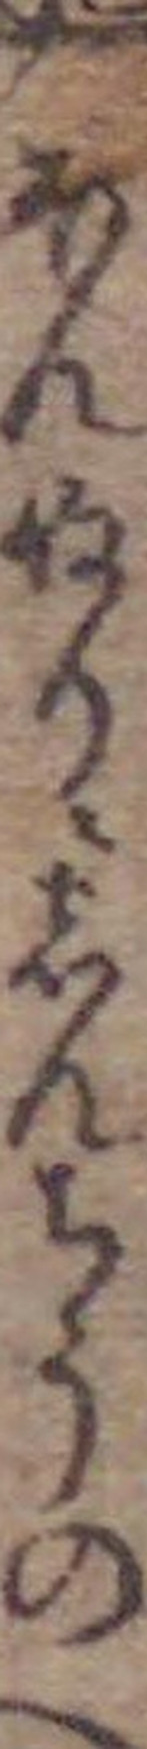ほんぬりにしんちうの
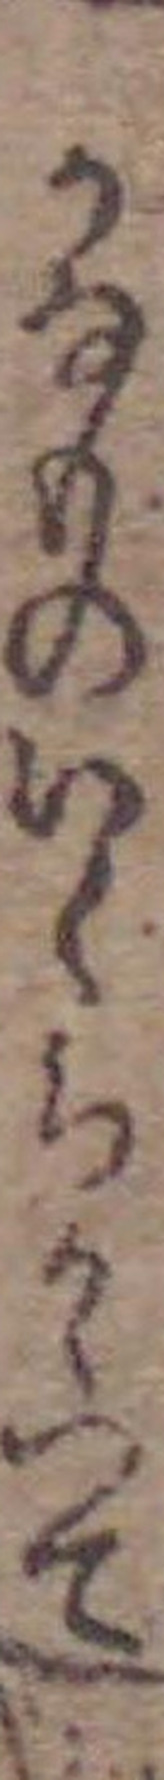かなものいくらかゝつて
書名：江戸生艶気樺焼 : 3巻
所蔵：国立国会図書館 National Diet Library, JAPAN
